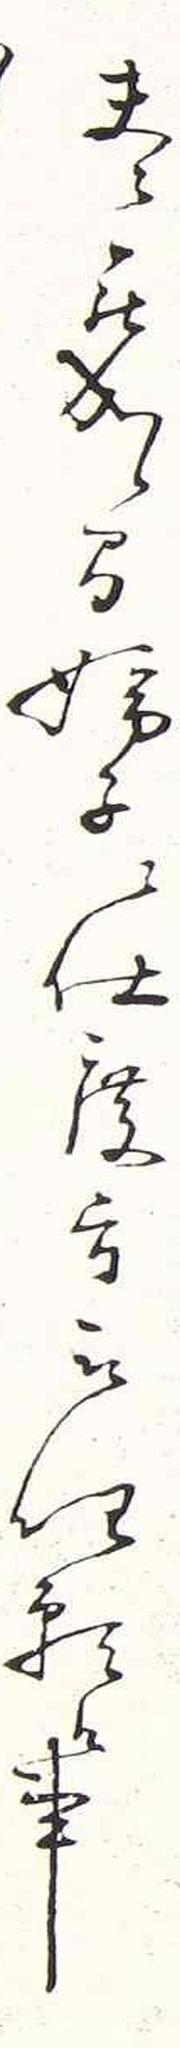夫ニ罷成候間嫡子ニ仕度旨被任願候事
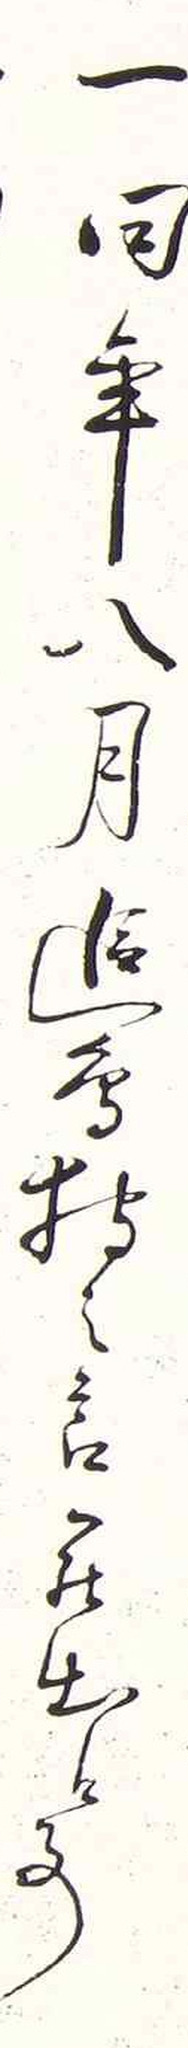一同年八月追鳥狩之節罷出候事
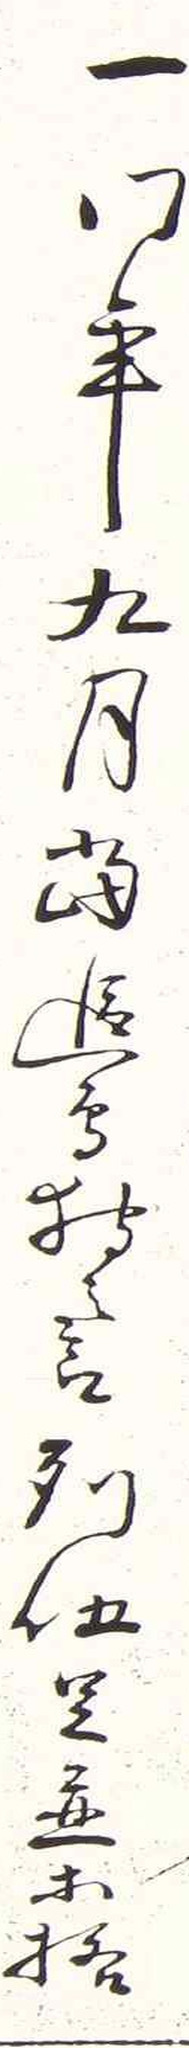一同年九月当追鳥狩之節列伍足並等格

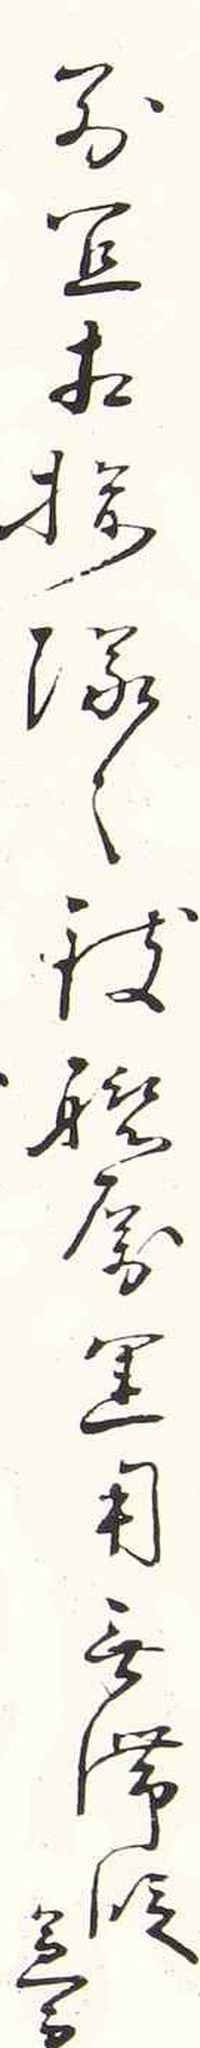別宜相揃隊々致聯属運用無滞段兼而
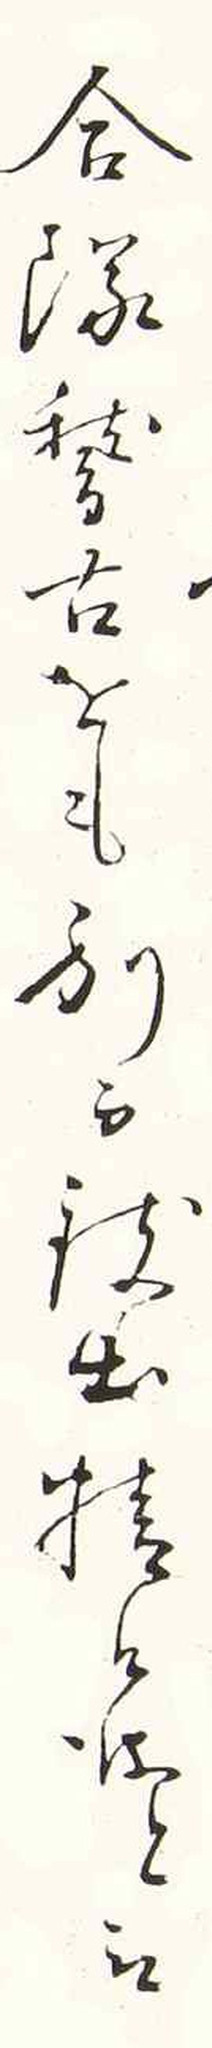合隊稽古をも別而致出精候儀と被
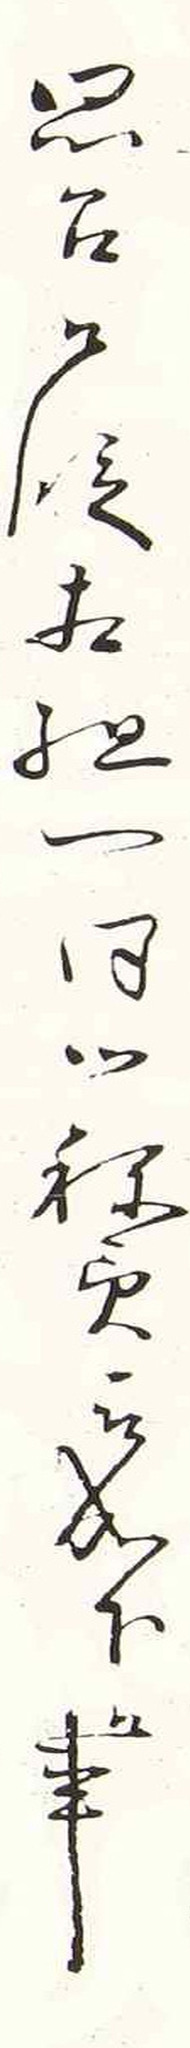思召候段相組一同御称美被成下候事
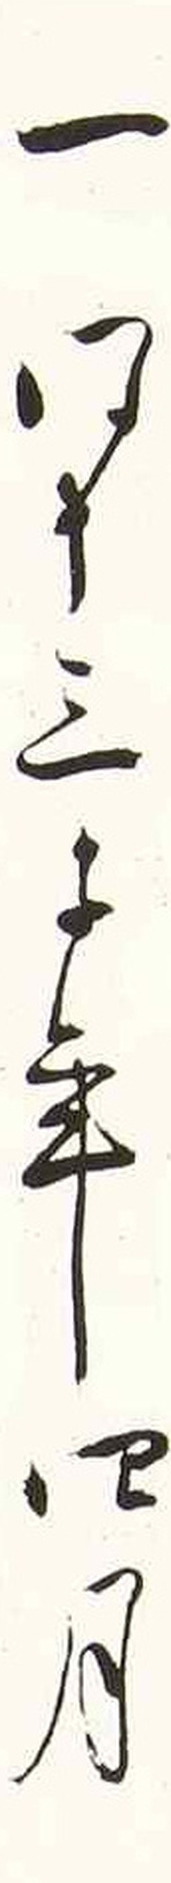一同十三子年四月
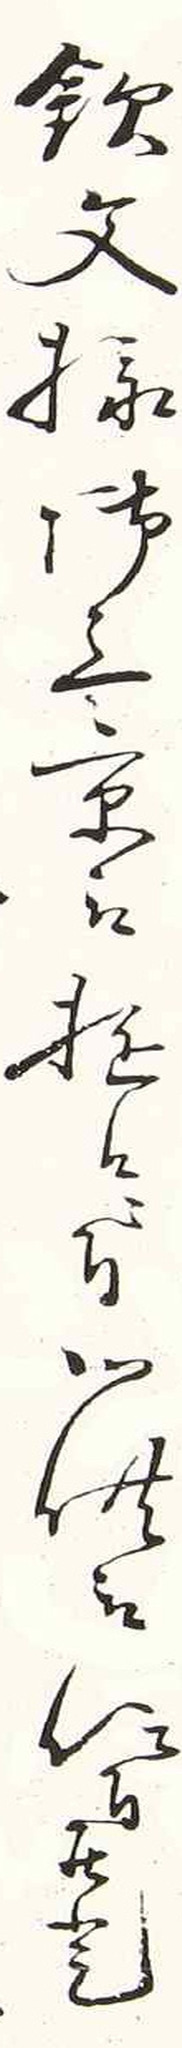欽文様御上京被遊候ニ付御供被仰付罷登
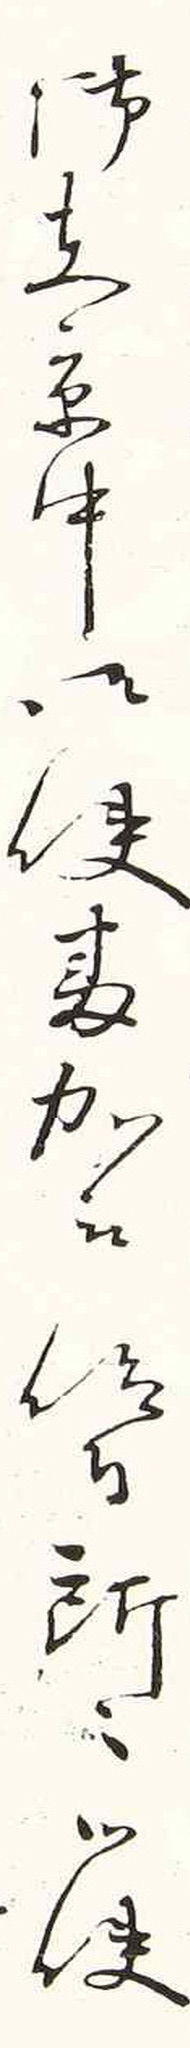御在京中御使番加被仰付所々御使
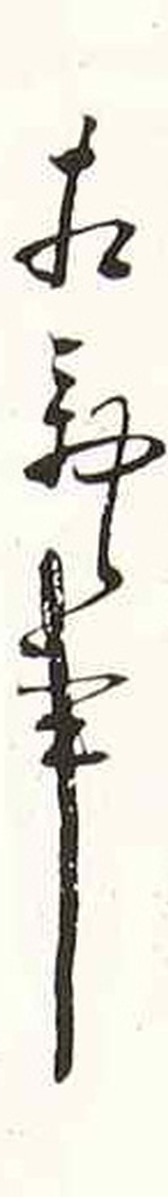相勤候事
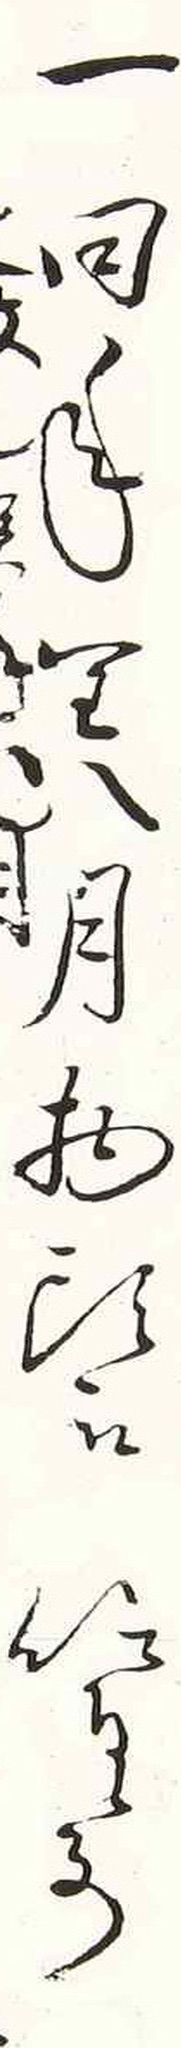一同年閏八月物頭被仰付候事
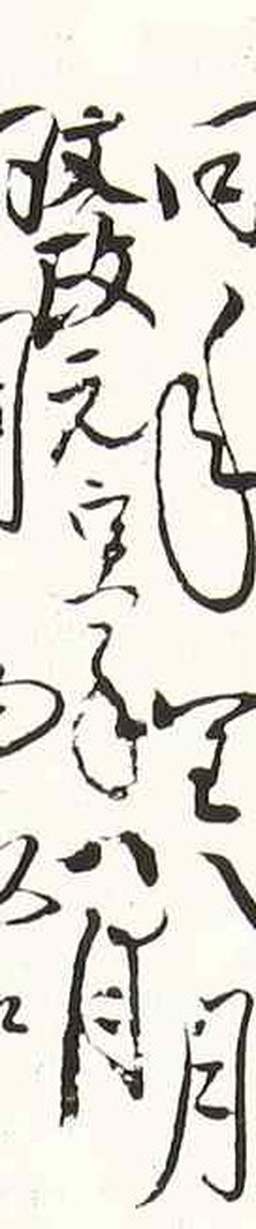文政元寅年八月
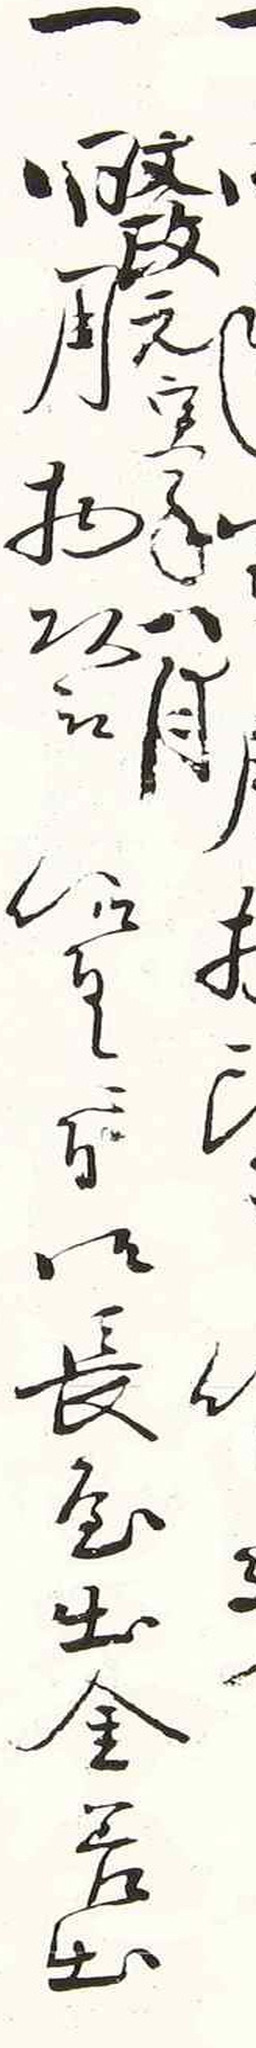一同月物頭被仰付候ニ付御長屋出金差出
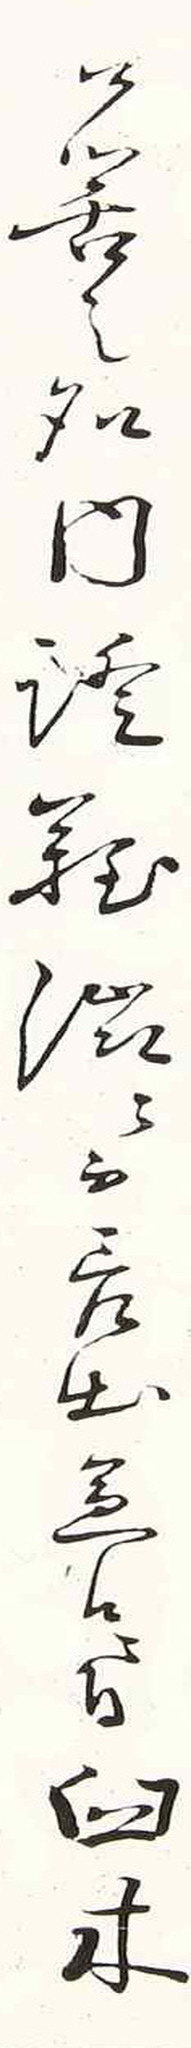候筈之処内証難渋ニ而差出兼候ニ付臼木
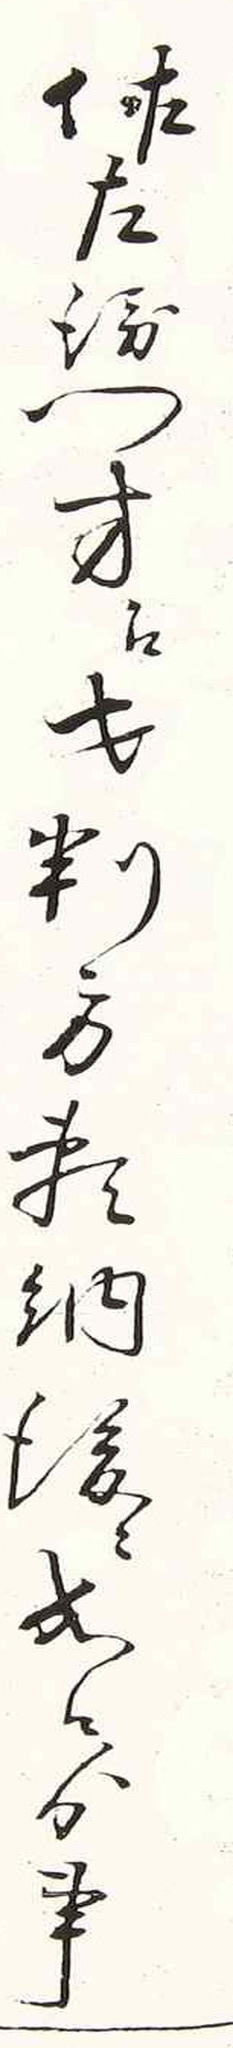佐左衛門方江才判方頼納後ニ成候ゟ事
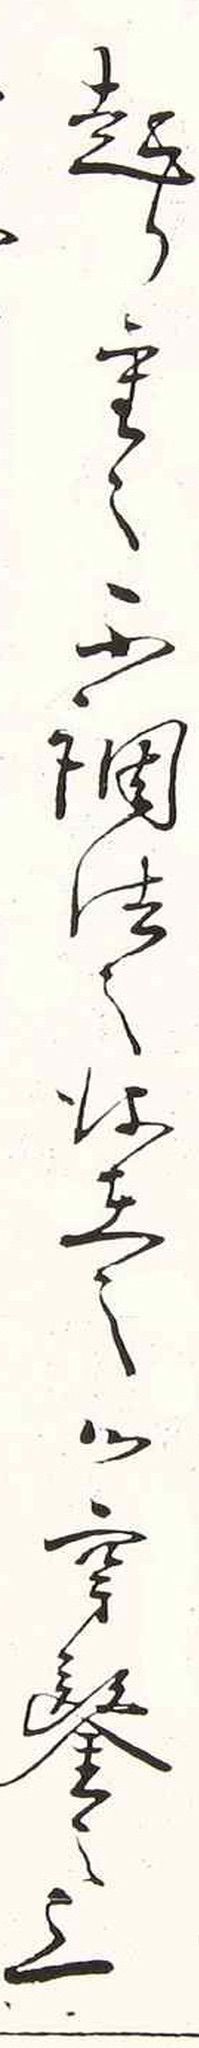起り重々不調法之儀在之御穿鑿之上
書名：諸士系譜　巻之357　す之部7
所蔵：会津若松市立会津図書館
